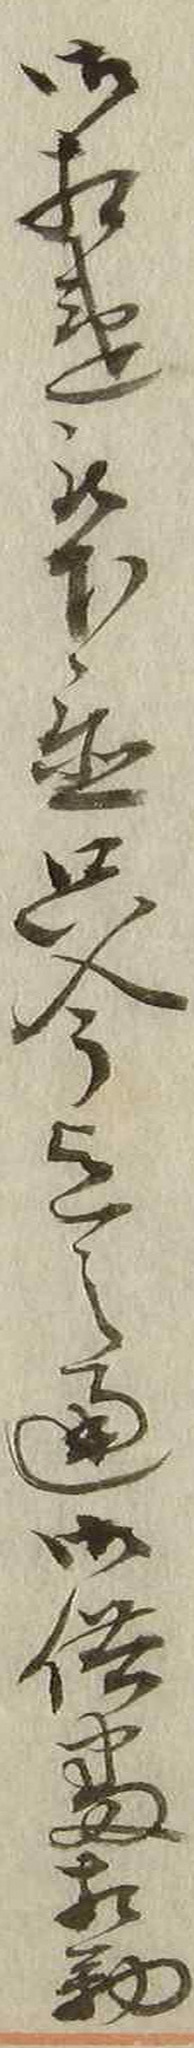御相違被下置只今迄之通御供番相勤
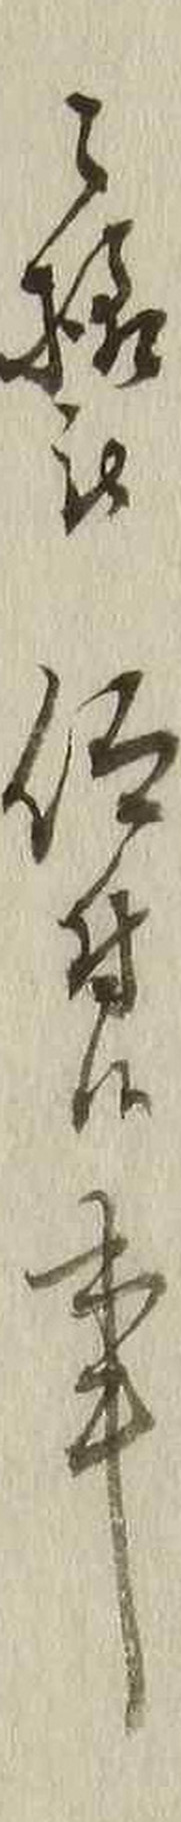候様被仰付候事
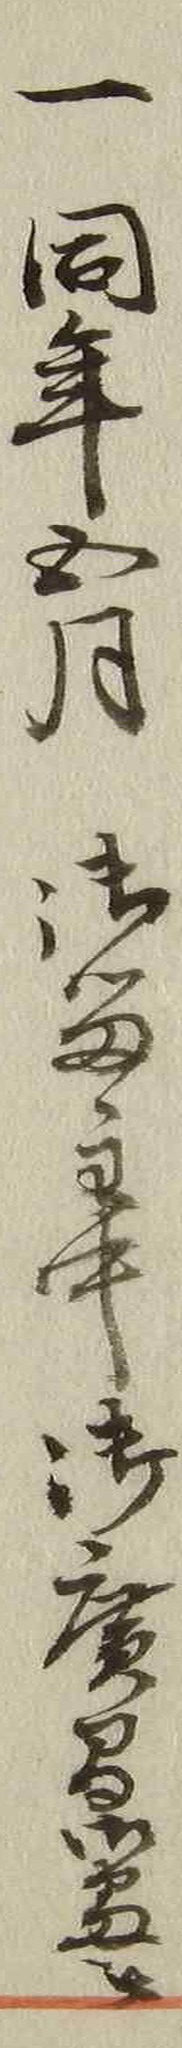一同年五月御留主中御広間御番被
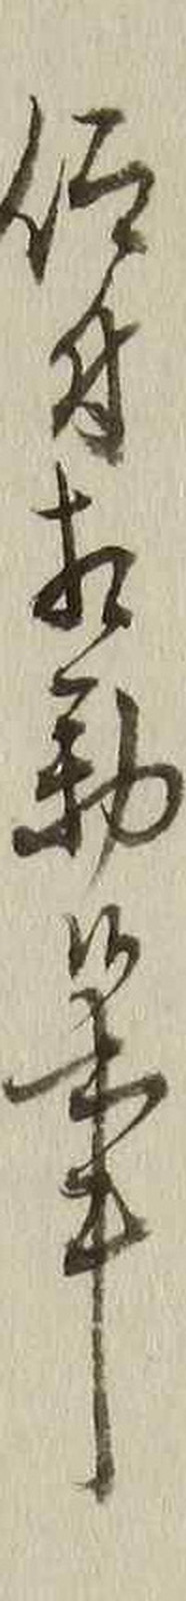仰付相勤候事
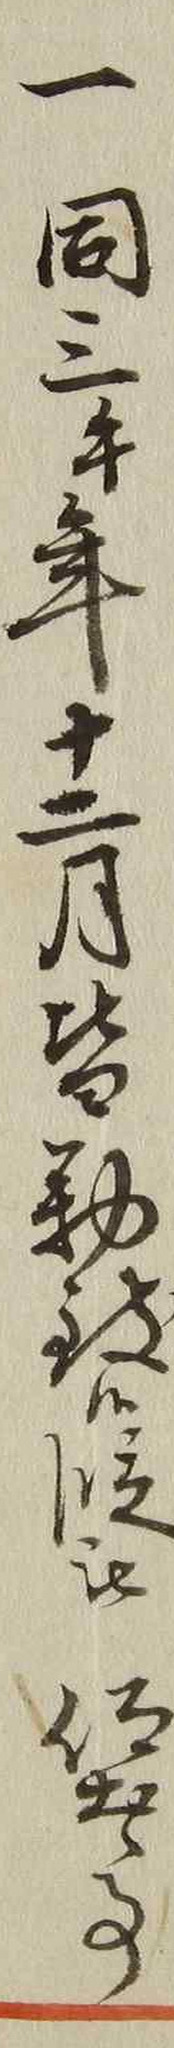一同三午年十二月皆勤致候段被仰出候事
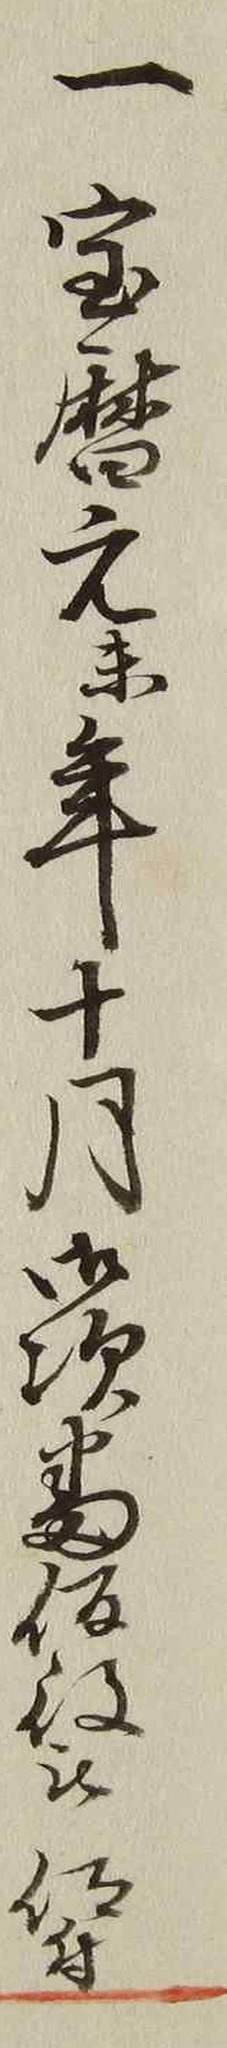一宝暦元未年十月御次番仮役被仰付
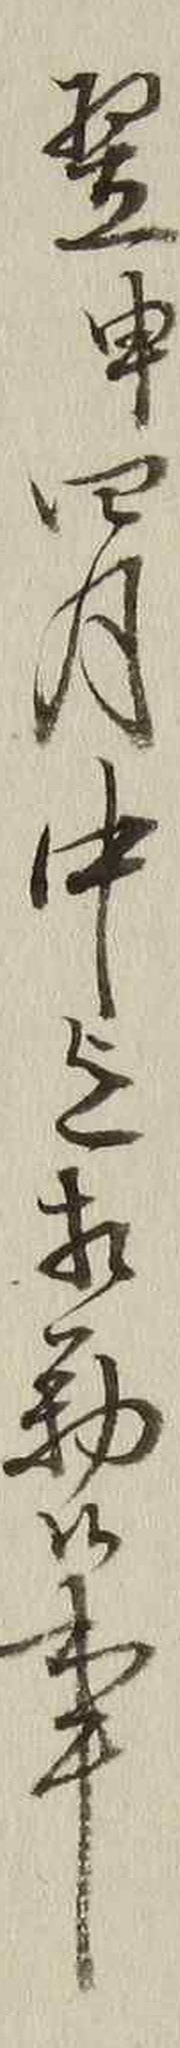翌申四月中迄相勤候事
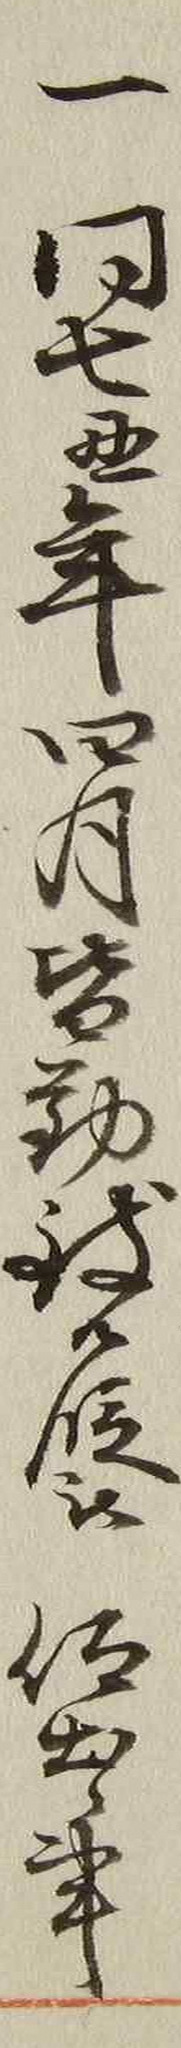一同七丑年四月皆勤致候段被仰出候事
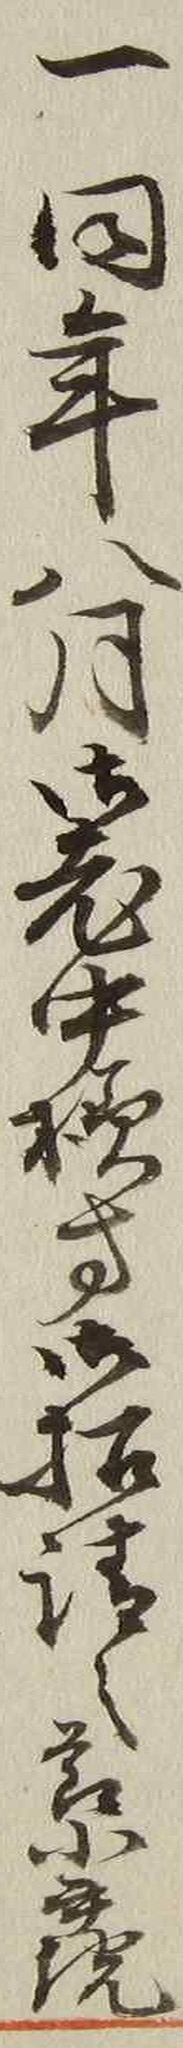一同年八月御老中様方御招請之節小書院
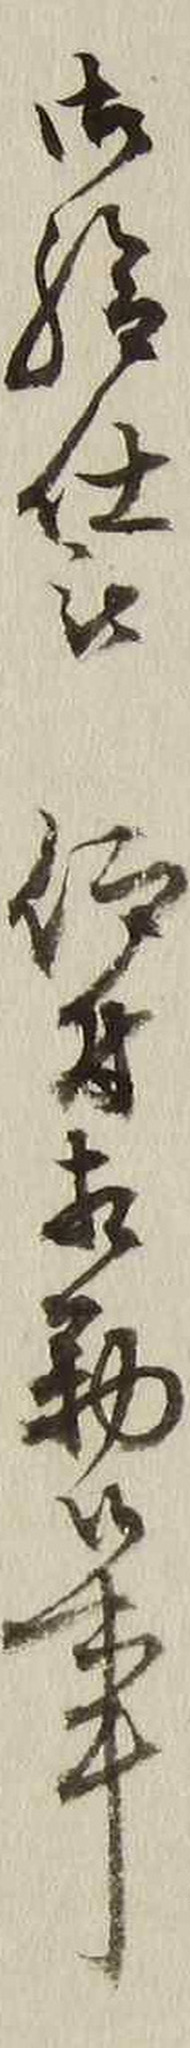御給仕被仰付相勤候事
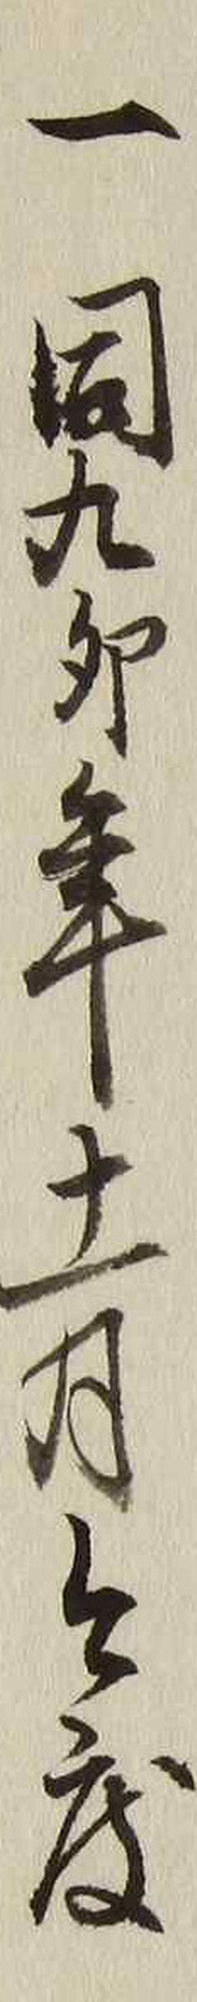一同九卯年十一月今度
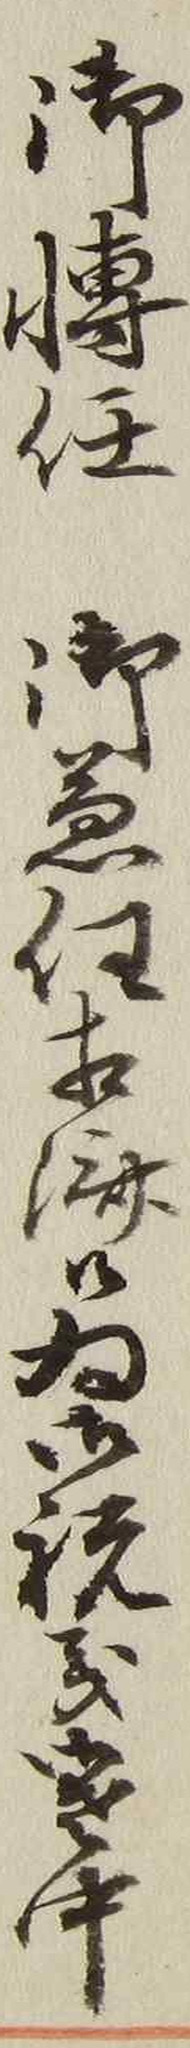御転任御兼任相済候為御祝義老中
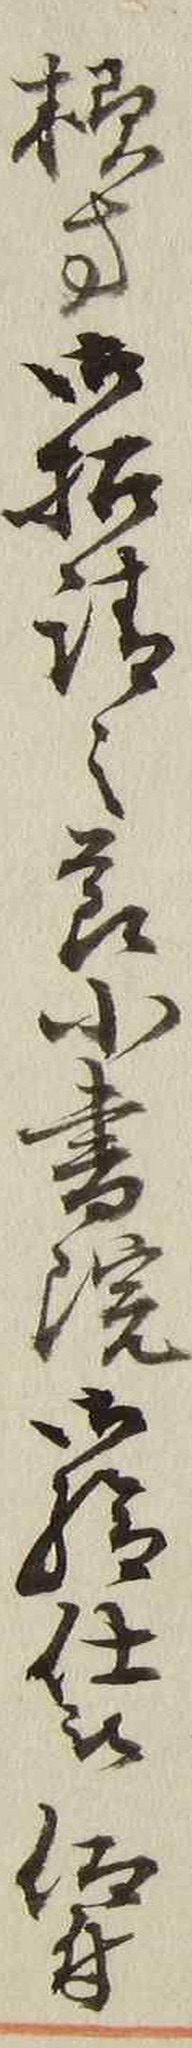様方御招請之節小書院御給仕被仰付
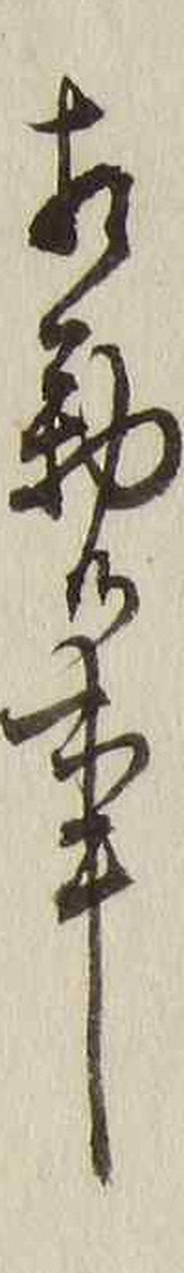相勤候事
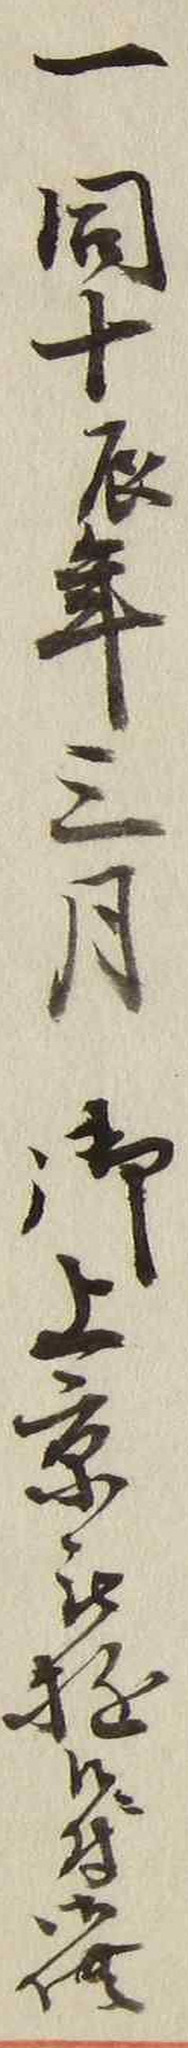一同十辰年三月御上京被遊候ニ付御供

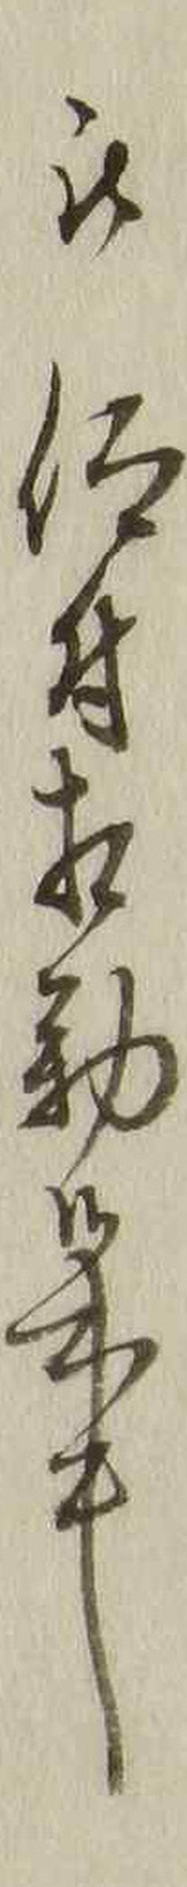被仰付相勤候事
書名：諸士系譜　巻之23　い之部23
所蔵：会津若松市立会津図書館
